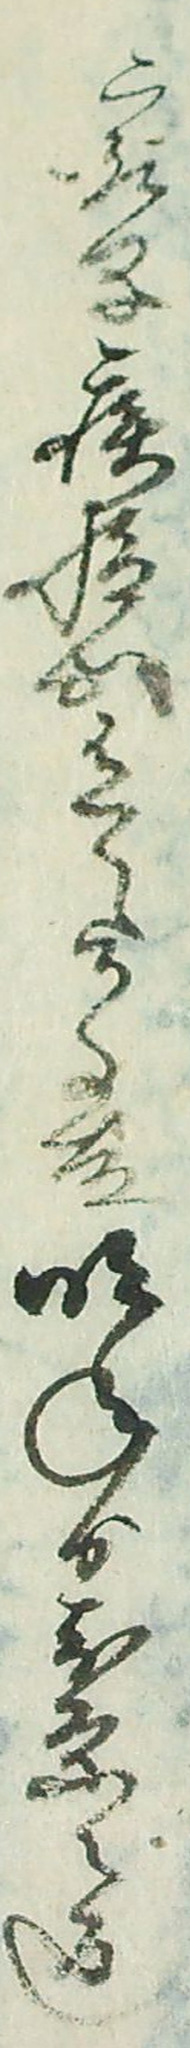最早疾指出有之候事故昨年ゟ前条之通
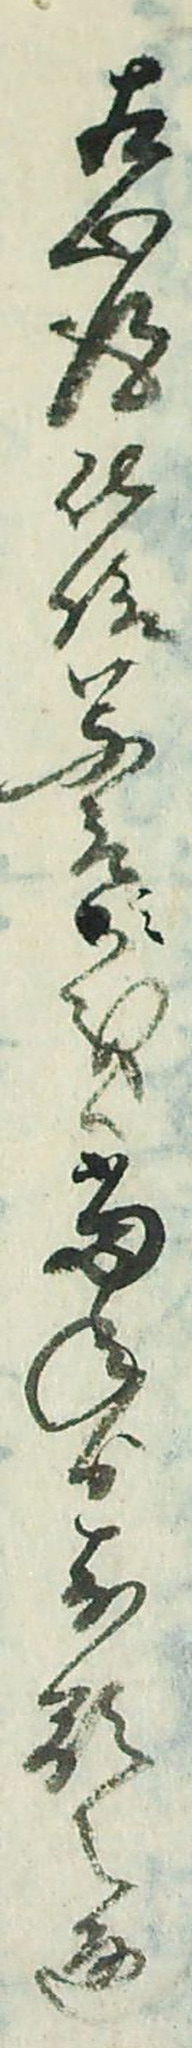相心得仕様写取之義ハ當年ゟ前顕之通
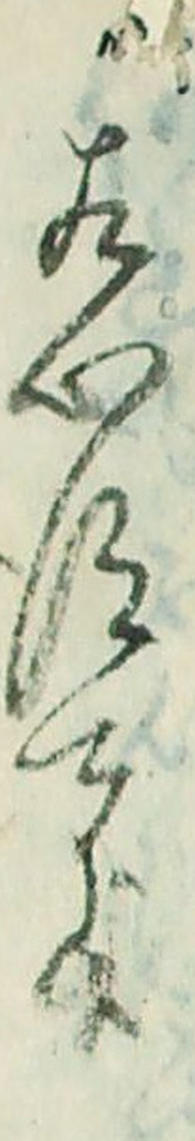相心得可申候
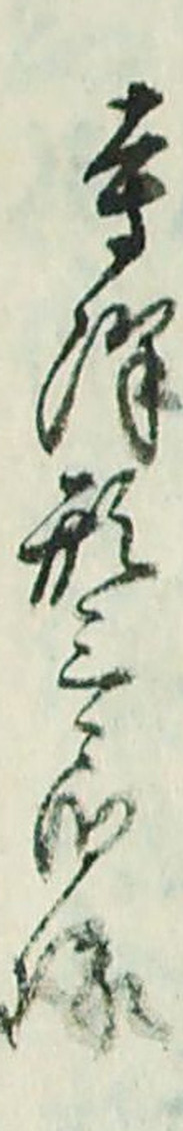寺澤形三郎様

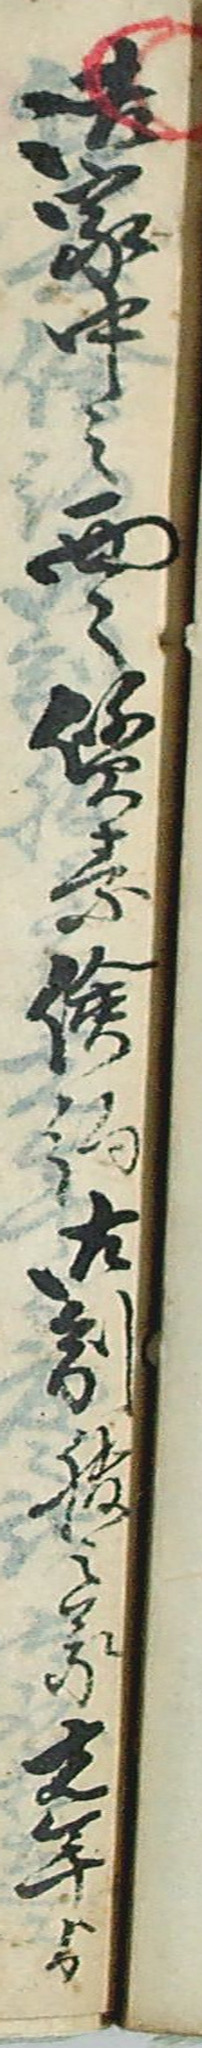御家中之面々質素倹約御制服之義先年ゟ
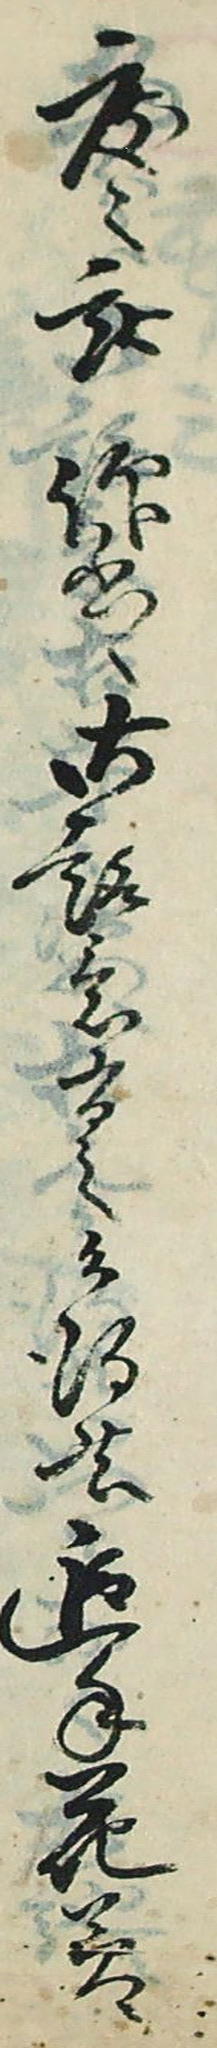度々被仰出候御趣意有之候得共近年花美ニ
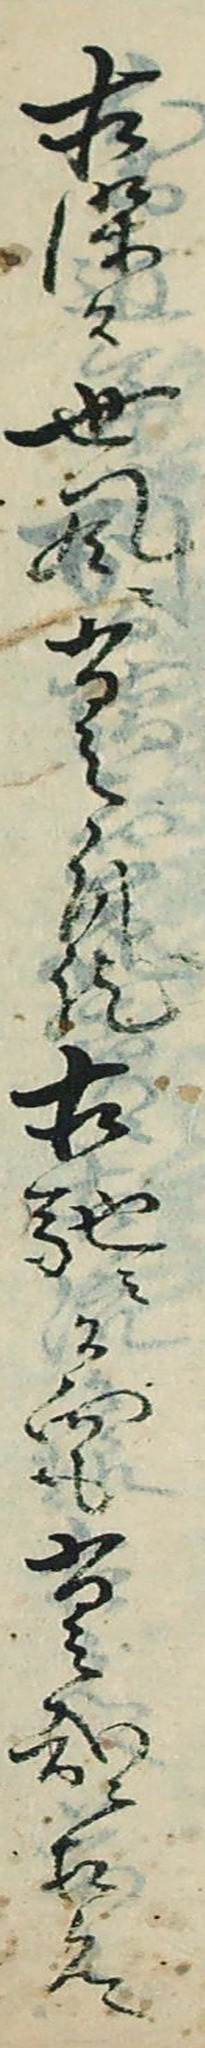相染候世風ニ有之自然相弛ミ候向も有之哉ニ相見へ
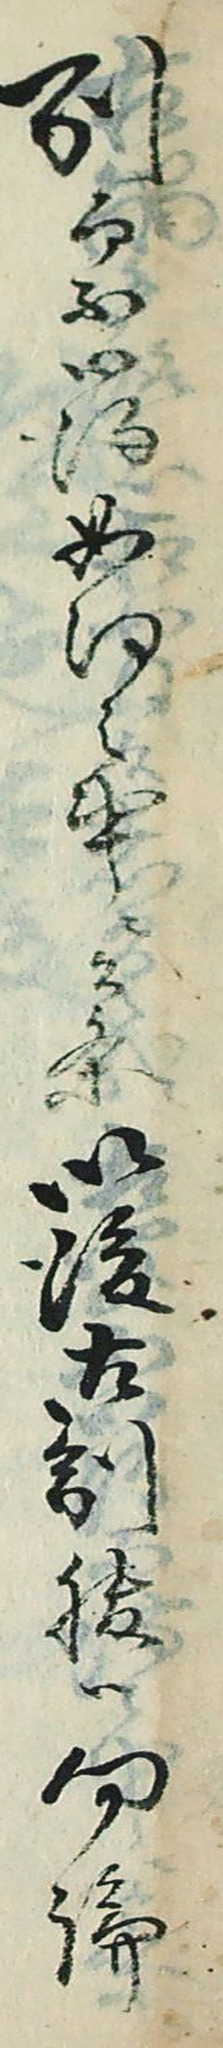別而不心得如何之事ニ候条以後御制服ハ勿論
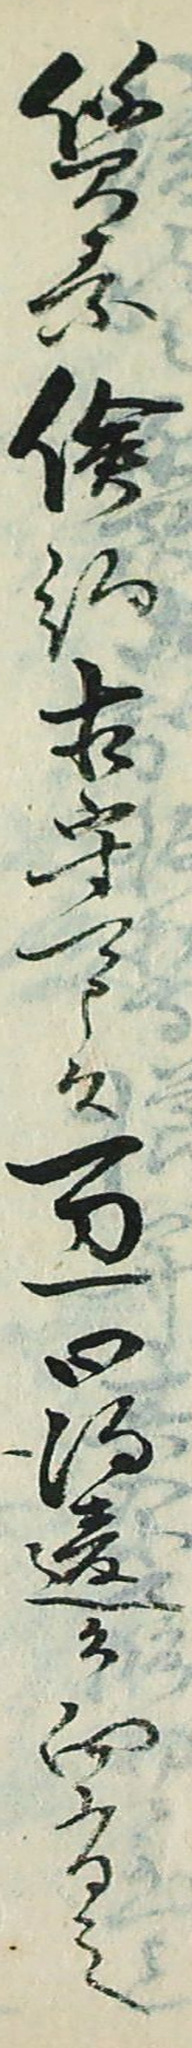質素倹約相守可申候万一心得違候向有之
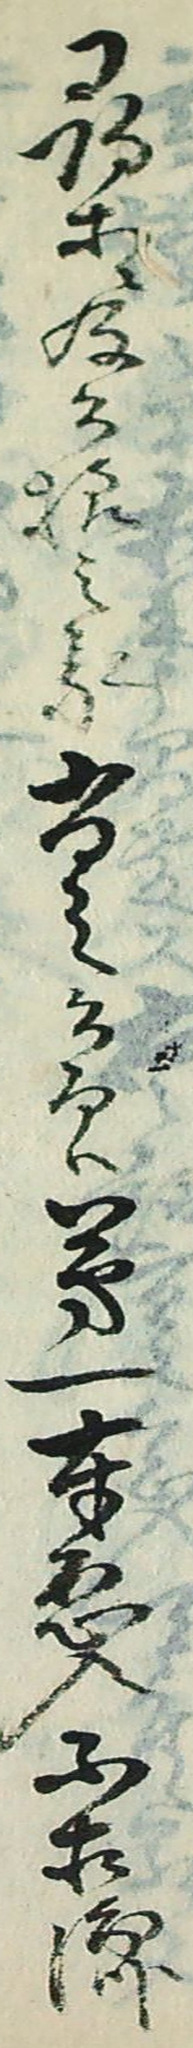尋等ニ及候様之義有之候而ハ第一奉恐入不相添
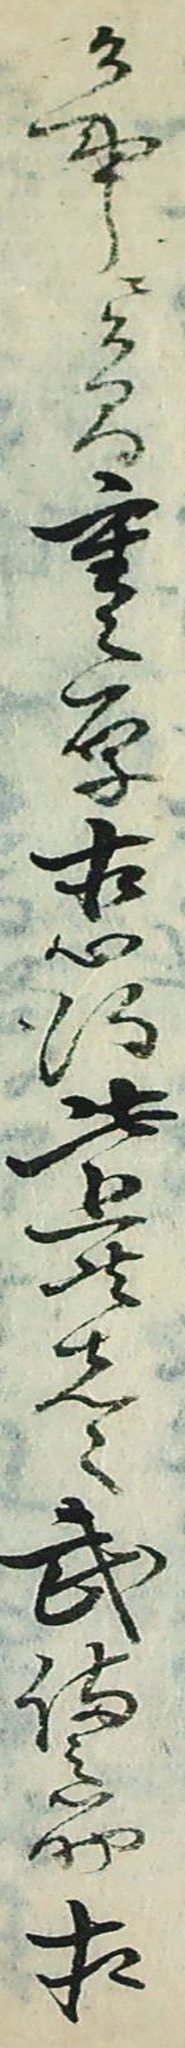候事ニ候間重々厚相心得此上共先々武備之筋相
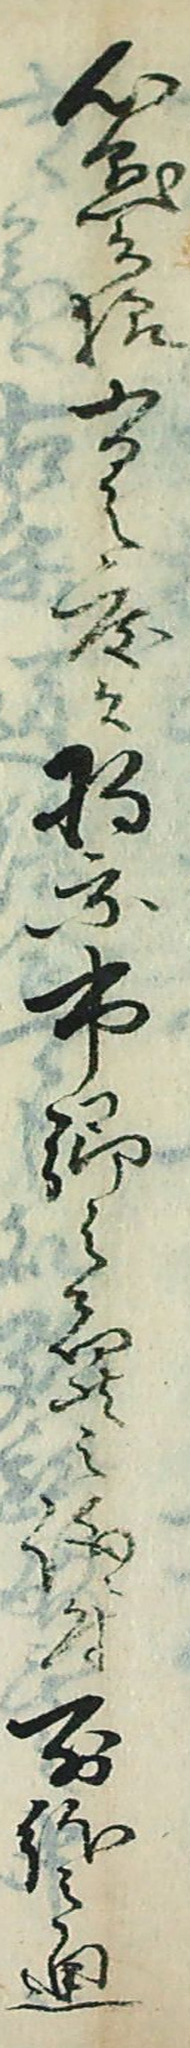心懸候様有之度候将亦市郷之者共之儀ニ付別紙之通
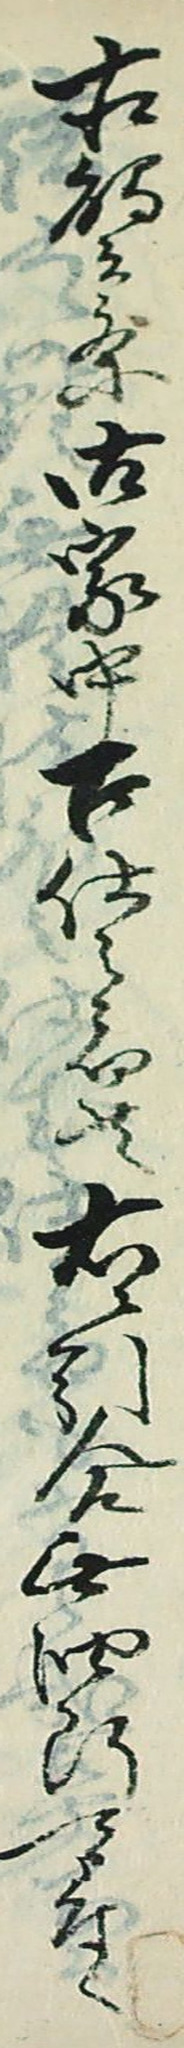相觸候条御家中召仕之者共右ニ引合無油断可申付候
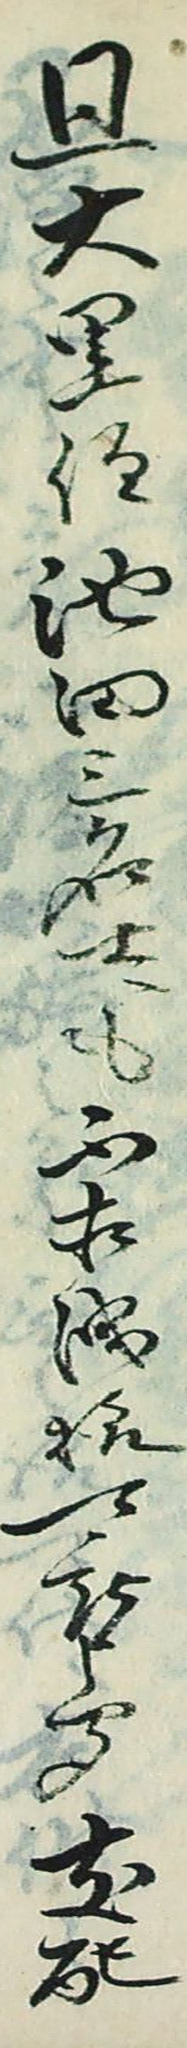且大里住池田三名士へも不相洩様可被申聞支配
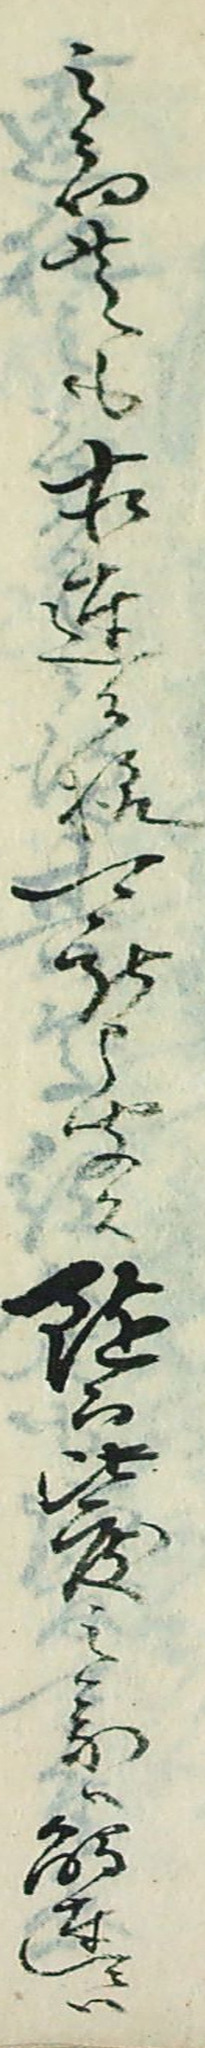之者共へも相達候様可被申聞候随而此度之義ハ觸達ニハ
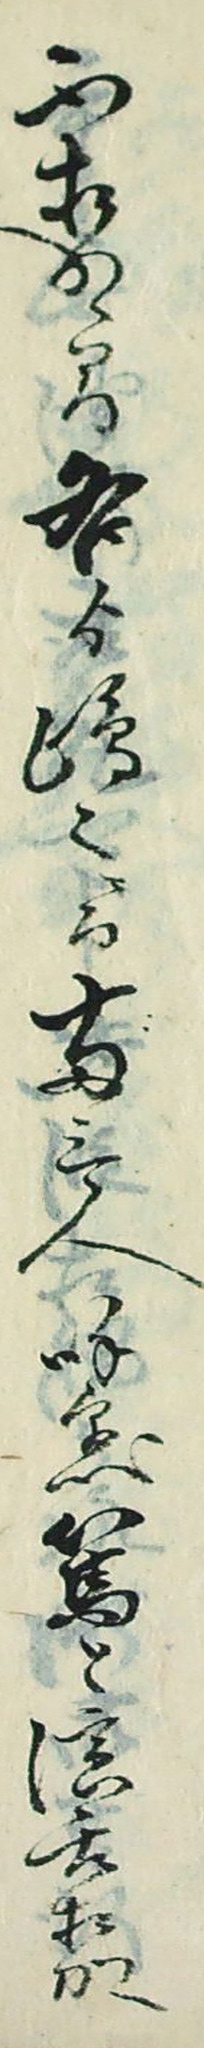不相成候間各ゟ崎々ニ而両三人呼懸篤と演舌相加へ
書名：諸御趣意書并御下知向之写
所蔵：鳴門教育大学 Naruto University of Education
